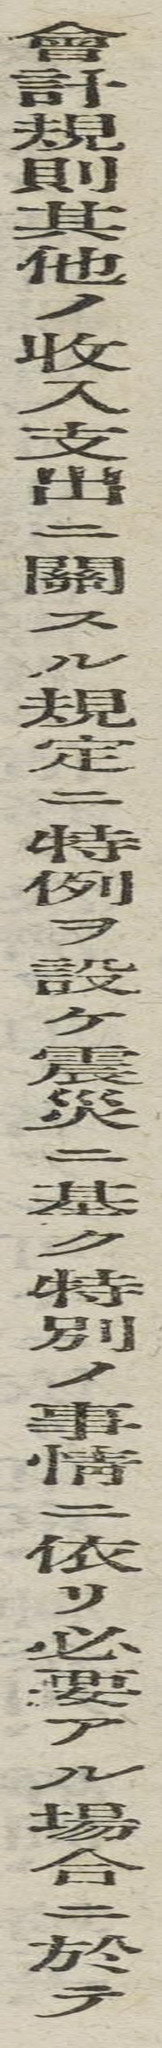会計規則其他ノ収入支出ニ関スル規定ニ特例ヲ設ケ震災ニ基ク特別ノ事情ニ依リ必要アル場合ニ於テ
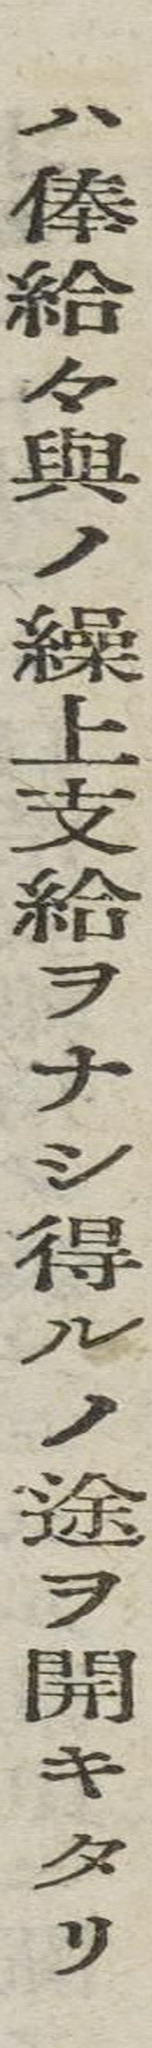ハ俸給々与ノ繰上支給ヲナシ得ルノ途ヲ開キタリ
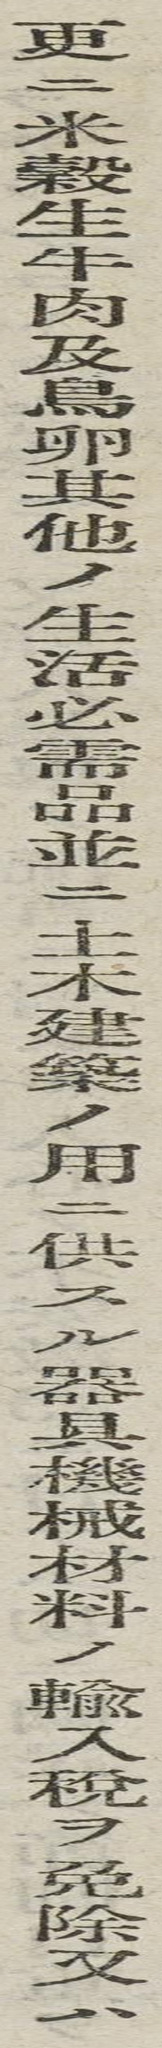更ニ米穀生牛肉及鳥卵其他ノ生活必需品並ニ土木建築ノ用ニ供スル器具機械材料ノ輸入税ヲ免除又ハ
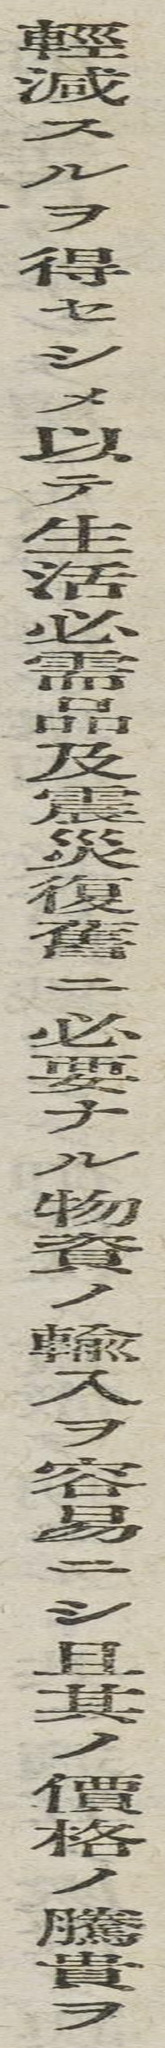軽減スルヲ得セシメ以テ生活必需品及震災復旧ニ必要ナル物資ノ輸入ヲ容易ニシ且其ノ価格ノ騰貴ヲ
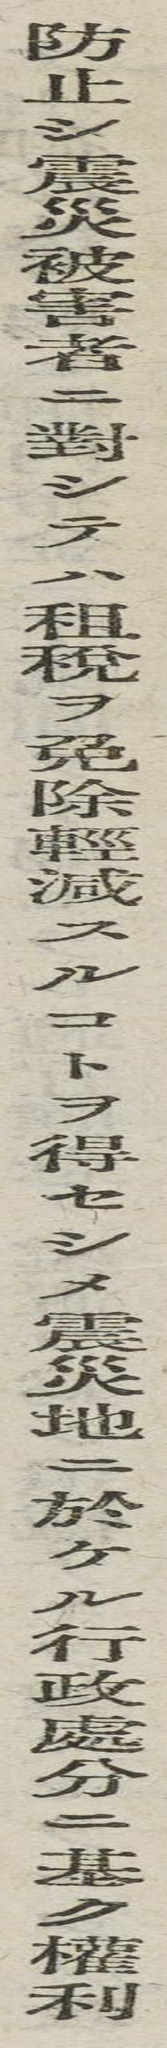防止シ震災被害者ニ対シテハ租税ヲ免除軽減スルコトヲ得セシメ震災地ニ於ケル行政処分ニ基ク権利
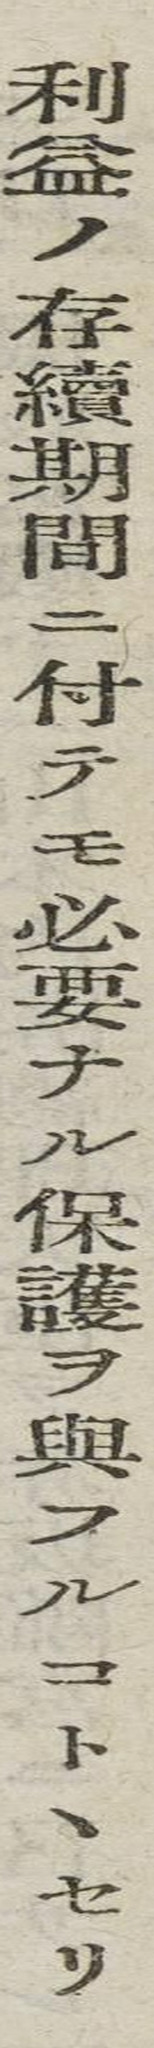利益ノ存続期間ニ付テモ必要ナル保護ヲ与フルコトヽセリ
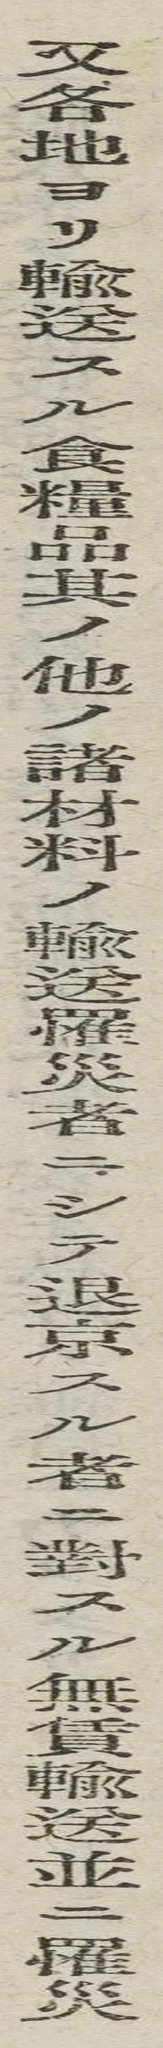又各地ヨリ輸送スル食糧品其ノ他ノ諸材料ノ輸送罹災者ニシテ退京スル者ニ対スル無賃輸送並ニ罹災
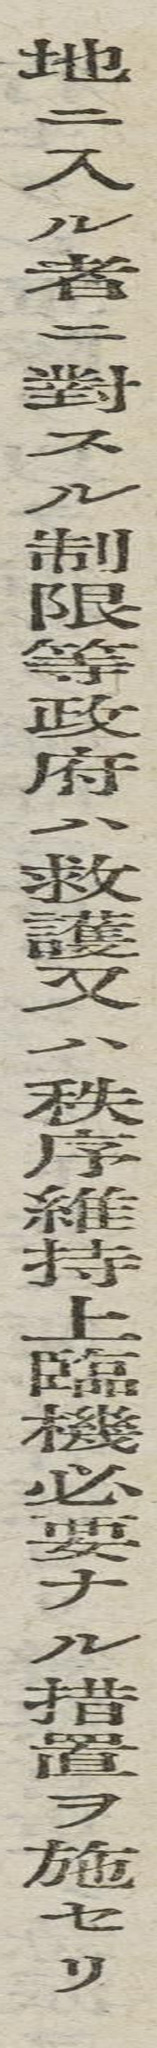地ニ入ル者ニ対スル制限等政府ハ救護又ハ秩序維持上臨機必要ナル措置ヲ施セリ
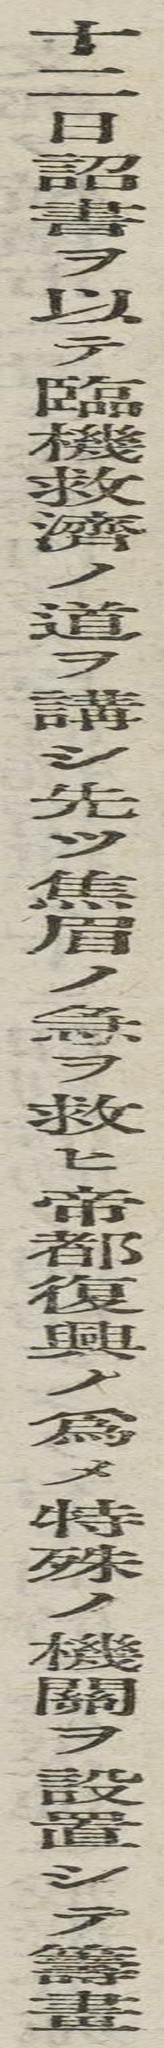十二日詔書ヲ以テ臨機救済ノ道ヲ講シ先ツ焦眉ノ急ヲ救ヒ帝都復興ノ為メ特殊ノ機関ヲ設置シテ籌畫
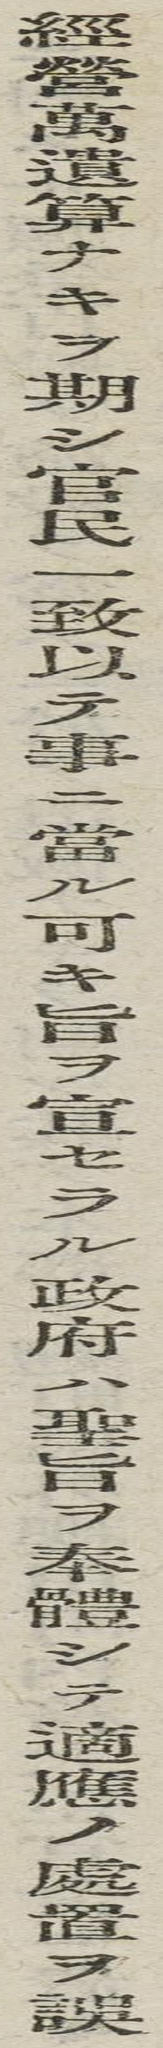経営万遺算ナキヲ期シ官民一致以テ事ニ当ル可キ旨ヲ宣セラル政府ハ聖旨ヲ奉体シテ適応ノ処置ヲ誤
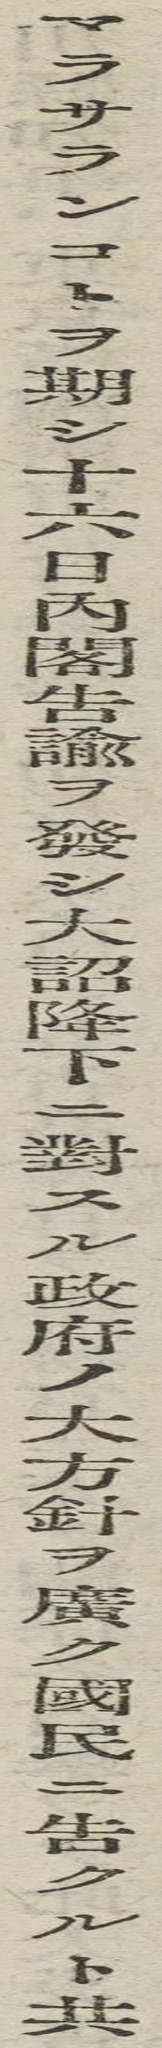マラサンコトヲ期シ十六日内閣告諭ヲ発シ大詔降下ニ対スル政府ノ大方針ヲ広ク国民ニ告クルト共
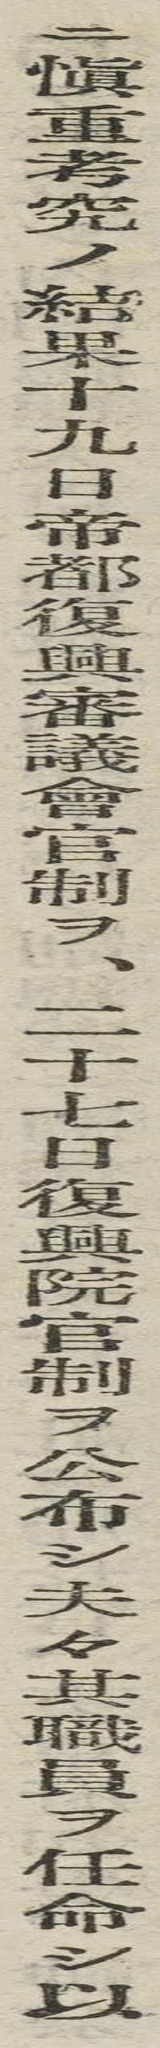ニ慎重考究ノ結果十九日帝都復興審議会官制ヲ、二十七日復興院官制ヲ公布シ夫々其職員ヲ任命シ以
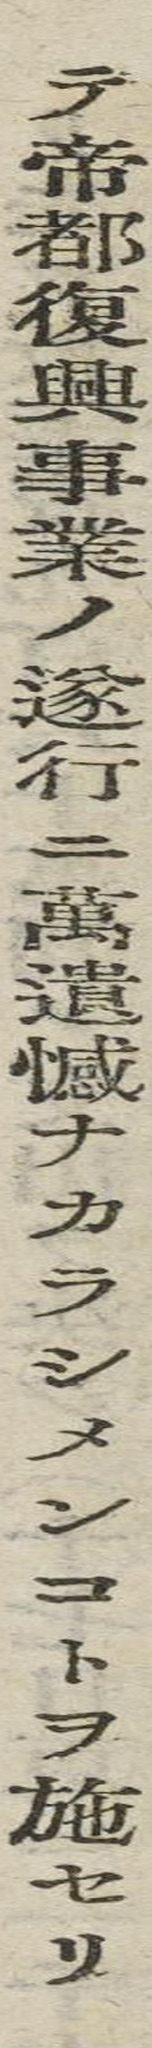テ帝都復興事業ノ遂行ニ万遺憾ナカラシメンコトヲ施セリ
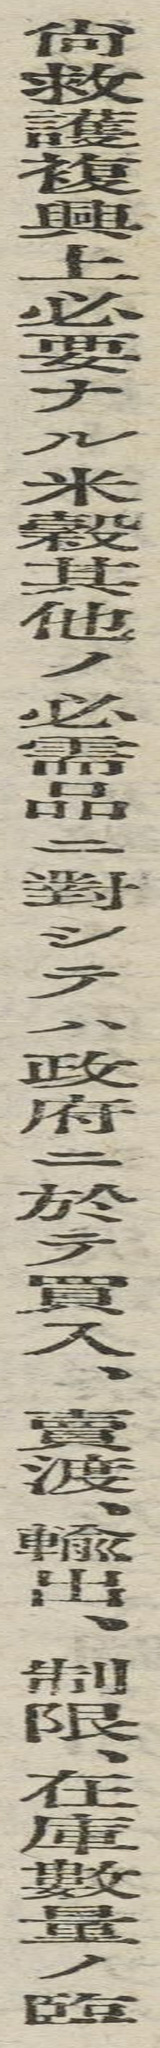尚救護復興上必要ナル米穀其他ノ必需品ニ対シテハ政府ニ於テ買入、売渡、輸出、制限、在庫数量ノ臨
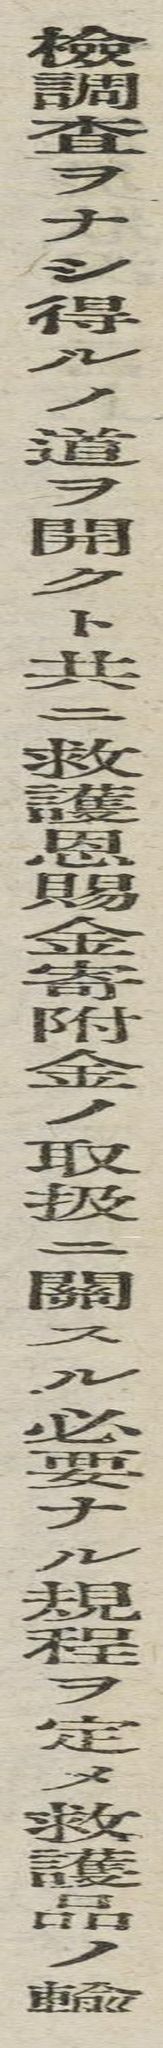検調査ヲナシ得ルノ道ヲ開クト共ニ救護恩賜金寄附金ノ取扱ニ関スル必要ナル規程ヲ定メ救護品ノ輸
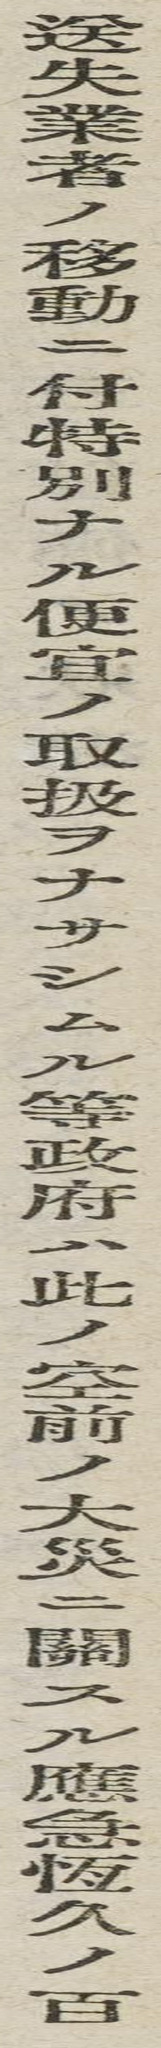送失業者ノ移動ニ付特別ナル便宜ノ取扱ヲナサシムル等政府ハ此ノ空前ノ大災ニ関スル応急恒久ノ百
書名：震災被害状況並救護施設概要
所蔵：東京大学地震研究所図書室 Earthquake Research Institute Library, The University of Tokyo, JAPAN
